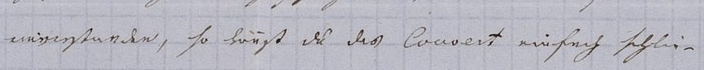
einverstanden, so kannst Du das Couvert einfach schlie-
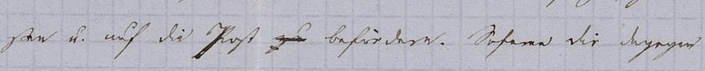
ßen u. auf die Post zu befördern. Soferne Dir dagegen
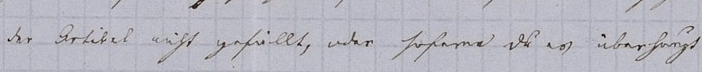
der Artikel nicht gefällt, oder soferne Du es überhaupt
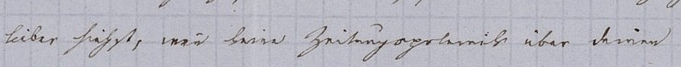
lieber siehst, wenn keine Zeitungspolemik über Deinen
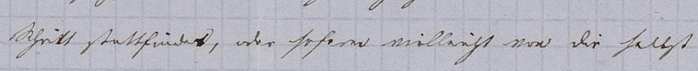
Schritt stattfinden, oder soferne vielleicht von Dir selbst
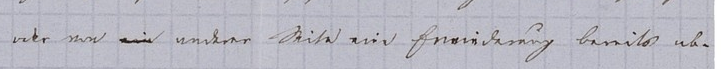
oder von ein anderer Seite eine Erwiederung bereits ab-
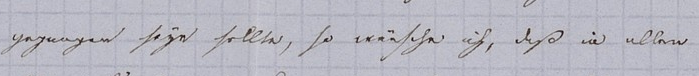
gegangen seyn sollte, so wünsche ich, daß in allen
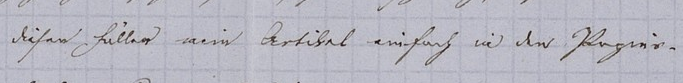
diesen Fällen mein Artikel einfach in den Papier-
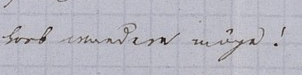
korb wandern möge!
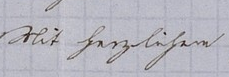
Mit herzlichem
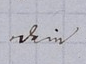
Dein
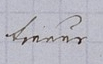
treuer
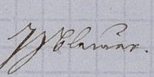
J J Blumer.
